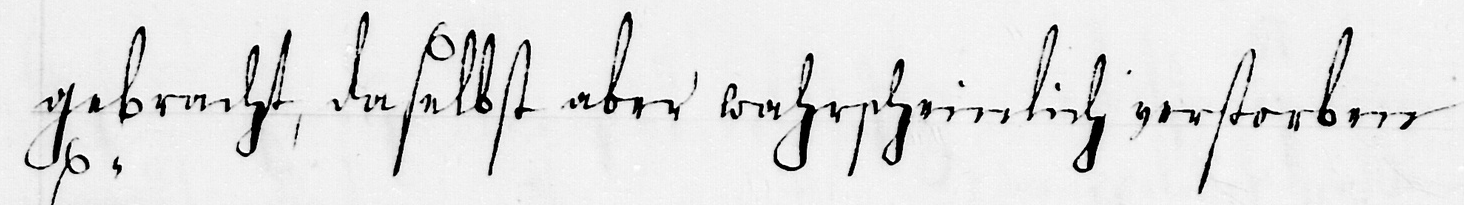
gebracht, daselbst aber wahrscheinlich verstorben
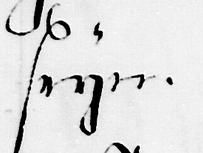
seyn.
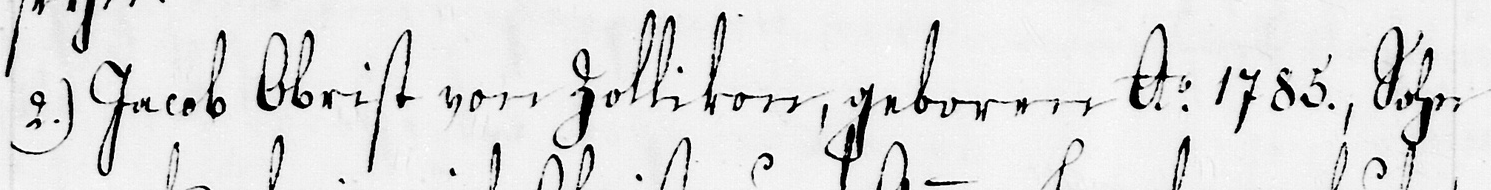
2.) Jacob Obrist von Zollikon, geboren Ao. 1785., Sohn
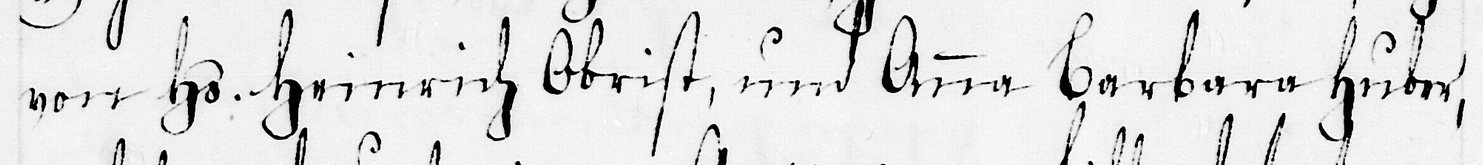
von Hs. Heinrich Obrist, und Anna Barbara Huber,
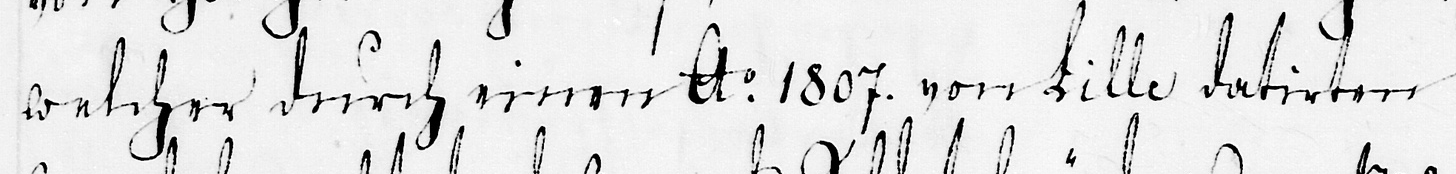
welcher durch einen Ao. 1807. von Lille datirten
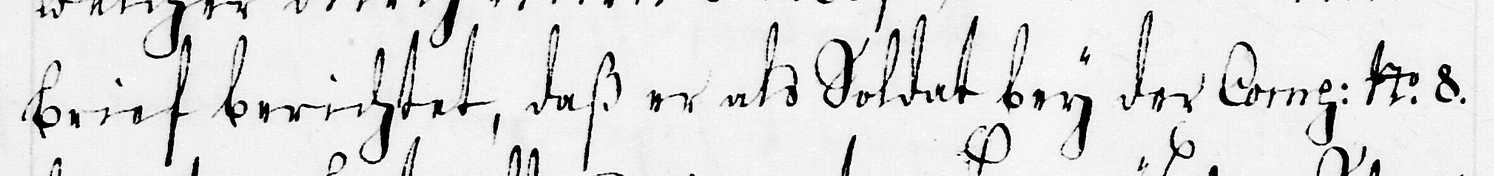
Brief berichtet, daß er als Soldat bey der Comp. No. 8.
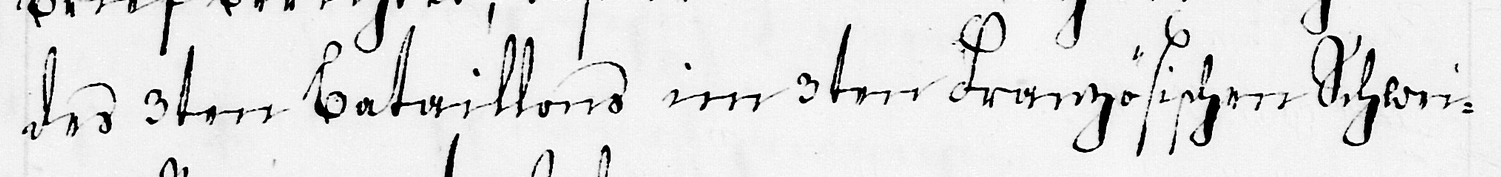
des 3ten Bataillons im 3ten Französischen Schwei¬
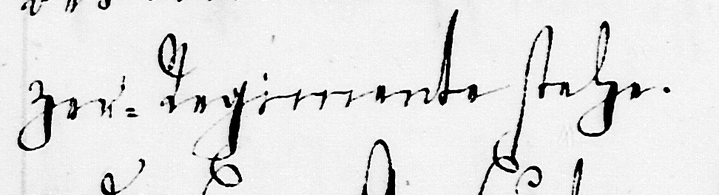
zer-Regimente stehe.
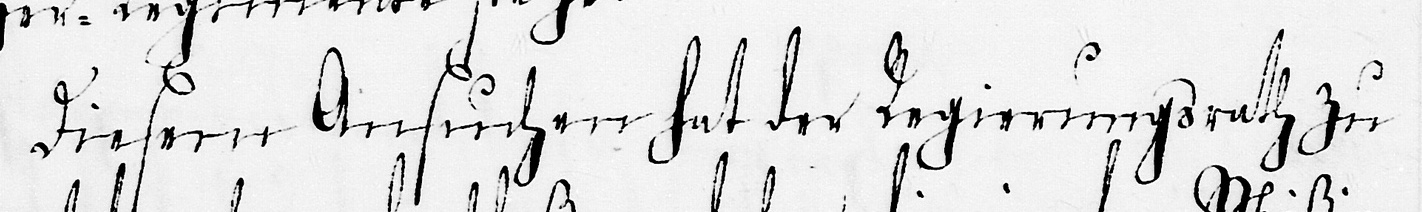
Diesem Ansuchen hat der Regierungsrath zu
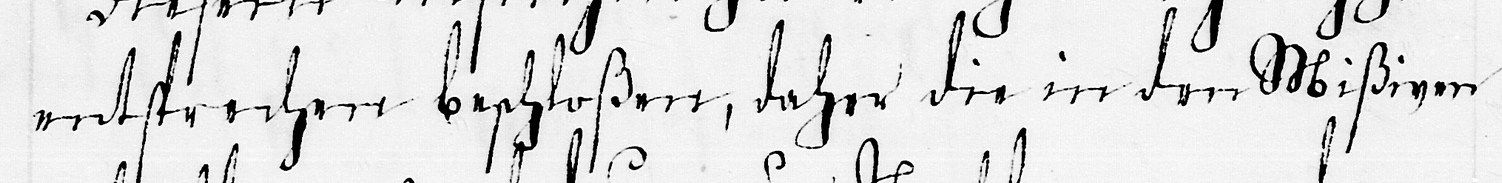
entsprechen beschloßen, daher die in den Mißiven
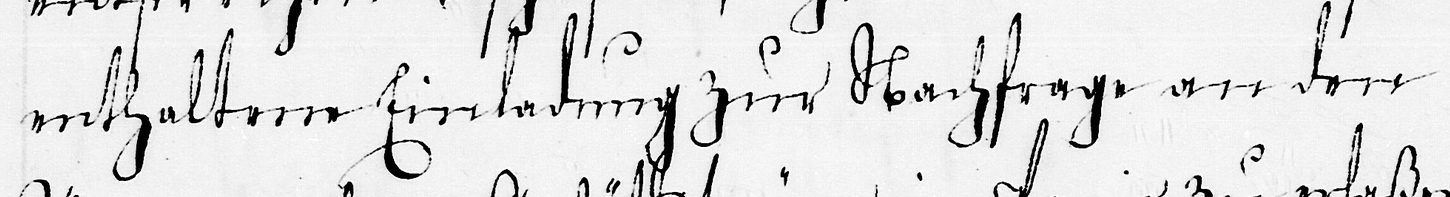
enthaltene Einladung zur Nachfrage an den
